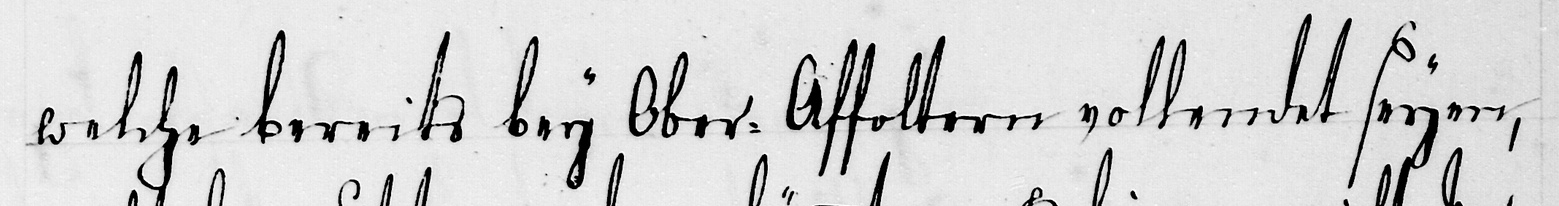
welche bereits bey Ober-Affoltern vollendet seyen,
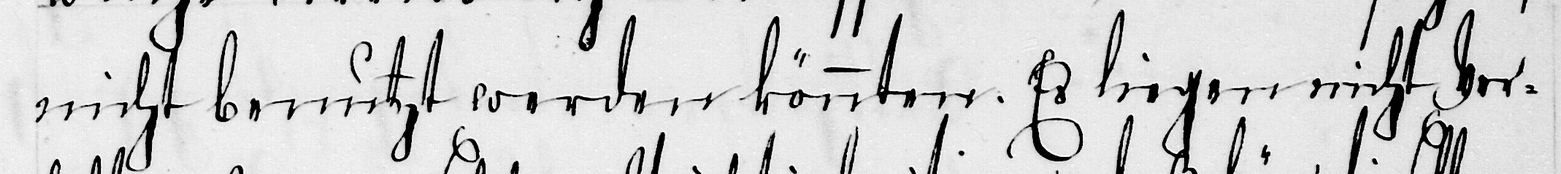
nicht benutzt werden könnten. Es liegen nicht Ver¬
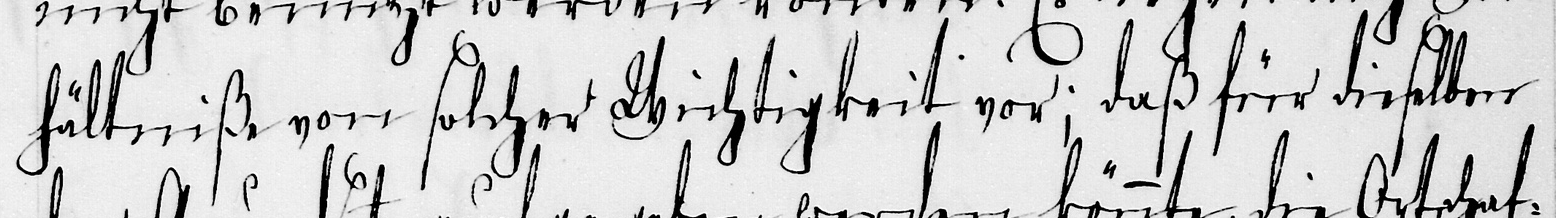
hältniße von solcher Wichtigkeit vor; daß für dieselben
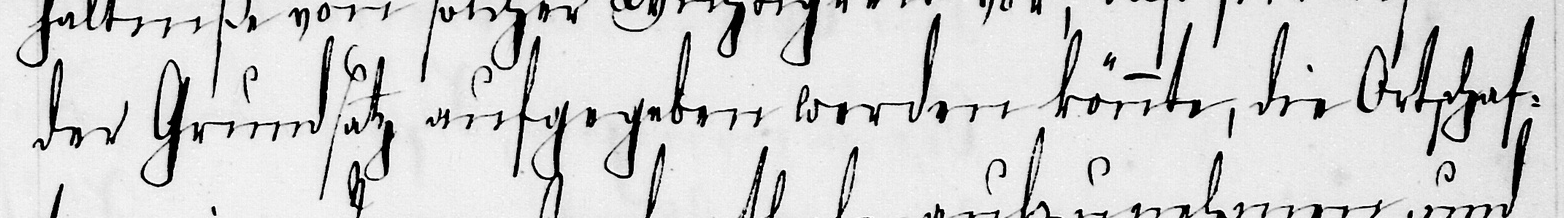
der Grundsatz aufgegeben werden könnte, die Ortschaf¬
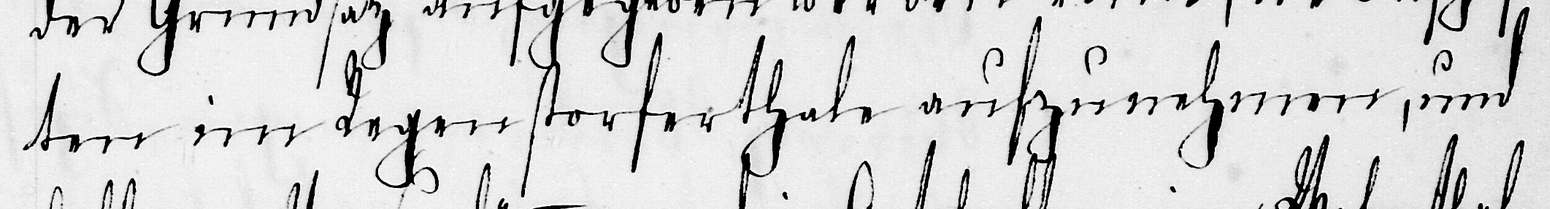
ten im Regenstorferthale aufzunehmen, und
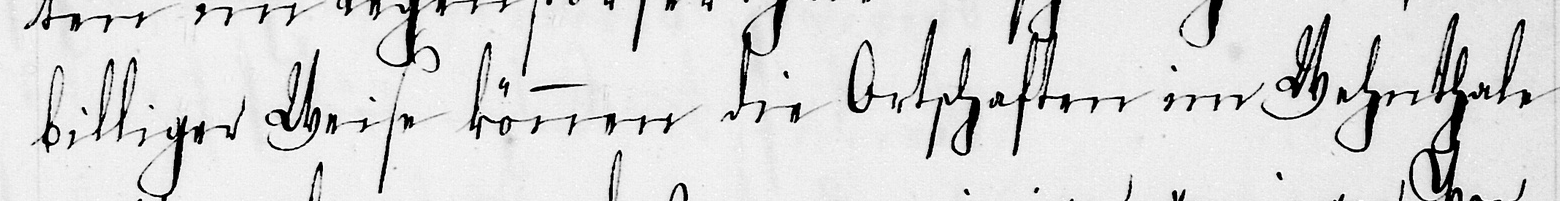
billiger Weise können die Ortschaften im Wehnthale
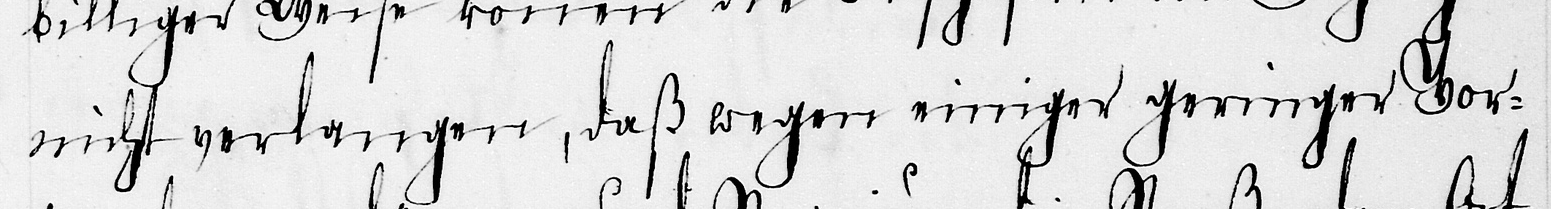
nicht verlangen, daß wegen einiger geringer Vor¬
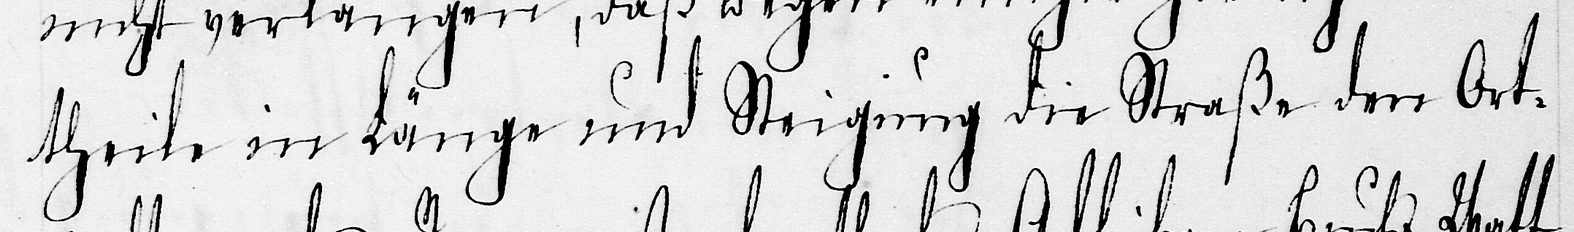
theile in Länge und Steigung die Straße den Orts¬
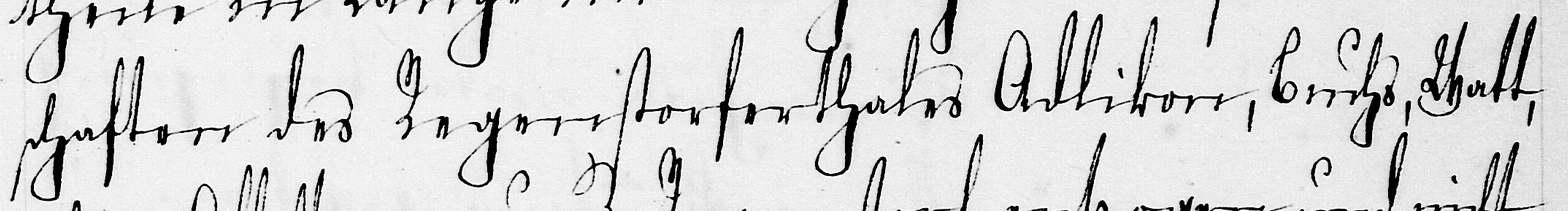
chaften des Regenstorferthales Adlikon, Buchs, Watt,
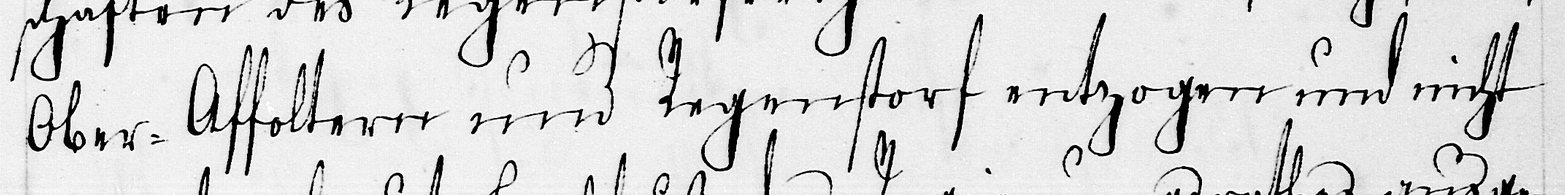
Ober-Affoltern und Regenstorf entzogen und nicht
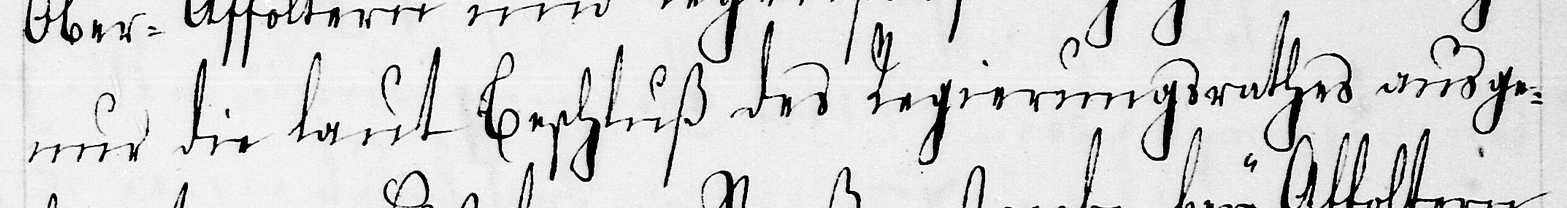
nur die laut Beschluß des Regierungsrathes ausge¬
